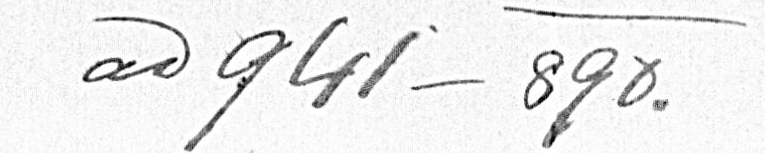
ad 941–890.
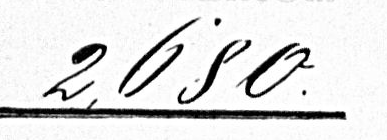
2680.
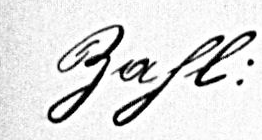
Zahl:
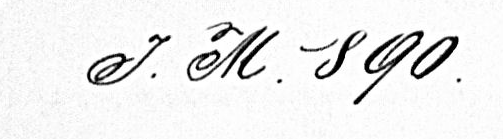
J.M. 890.
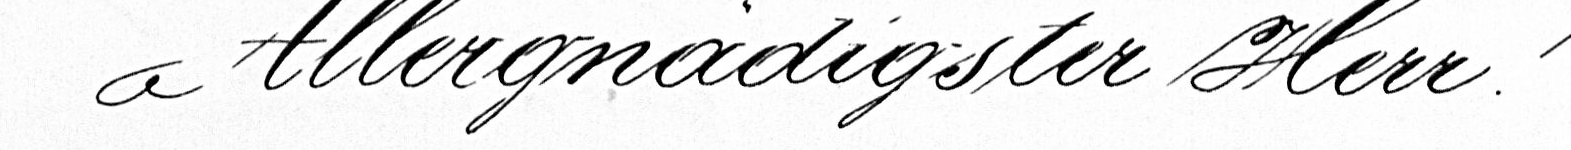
a Sn Allergnädigster Herr!
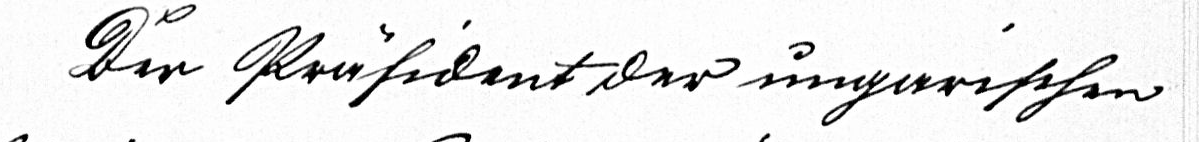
Der Präsident der ungarischen
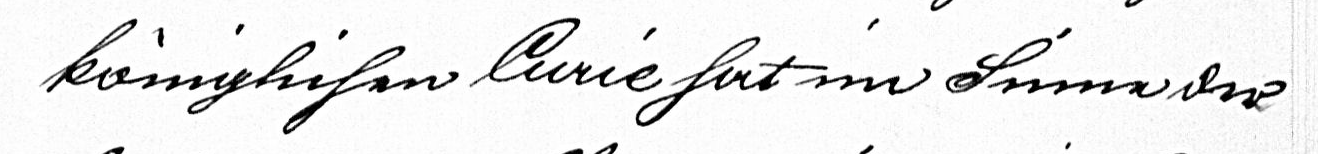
königlichen Curie hat im Sinne der
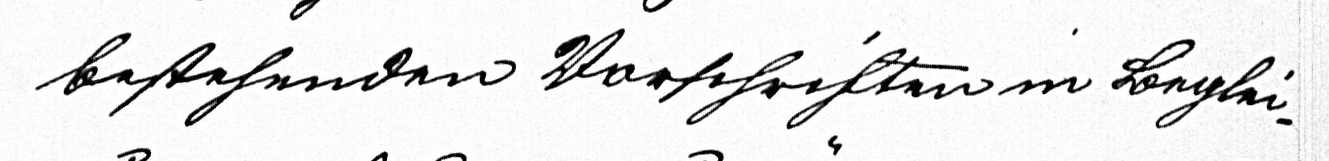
bestehenden Vorschriften in Beglei¬
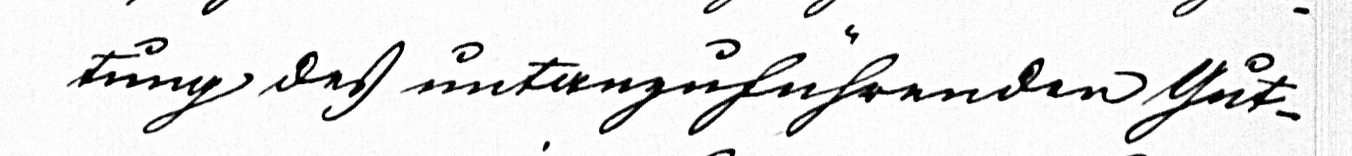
tung des untanzuhührenden Gut¬
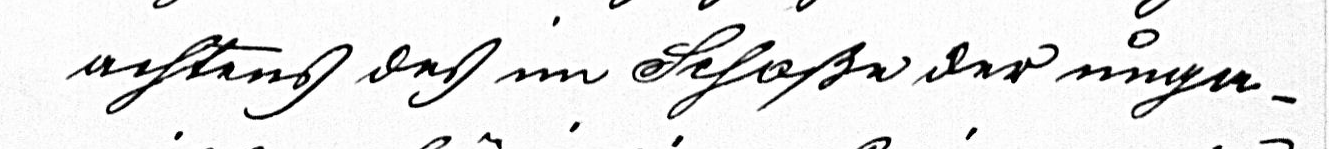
achtens des im Schoße der unga¬
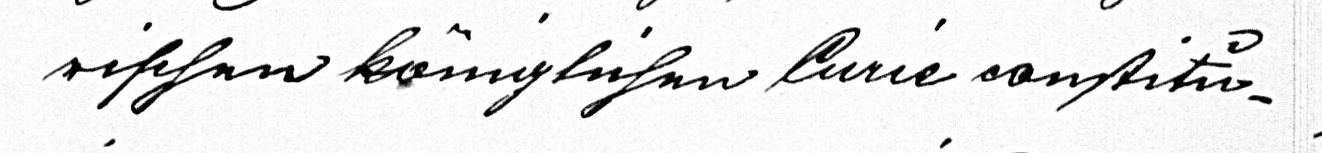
rischen königlichen Curie constitu¬
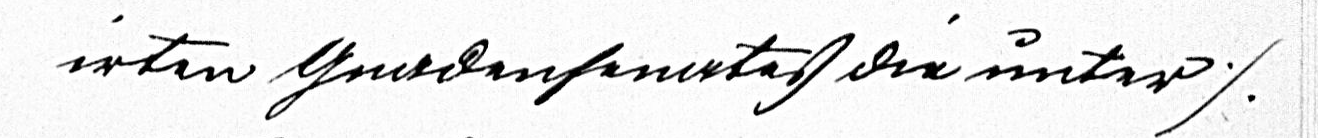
irten Gnadensenates die unter ./.
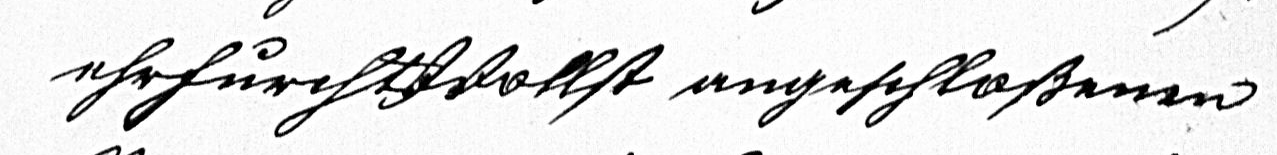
ehrfurchtsvollst angeschloßenen
